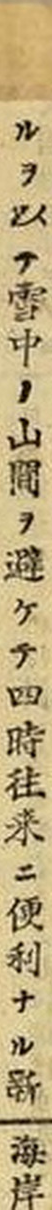ルヲ以テ雪中ノ山間ヲ避ケテ四時往来ニ便利ナル新
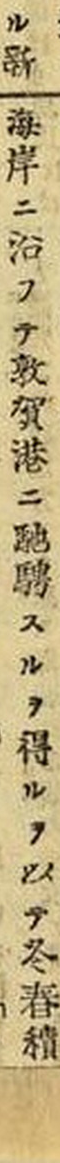海岸ニ沿フテ敦賀港ニ馳騁スルヲ得ルヲ以テ冬春積
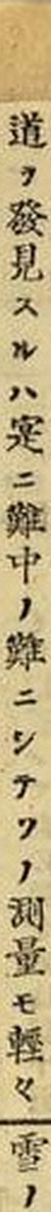道ヲ發見スルハ寔ニ難中ノ難ニシテソノ測量モ輕々
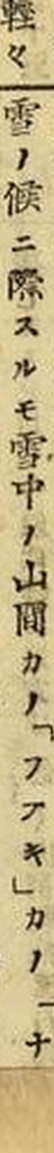雪ノ候ニ際スルモ雪中ノ山間カノ「フブキ」カノ「ナ
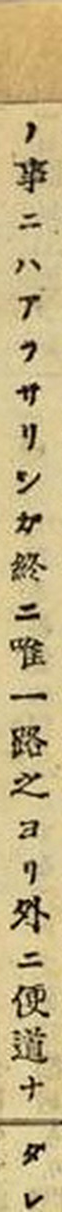ノ事ニハアラサリシガ終ニ唯一路之ヨリ外ニ便道ナ
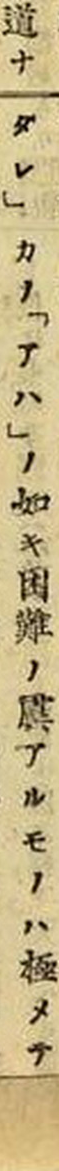ダレ」カノ「アハ」ノ如キ困難ノ愚アルモノハ極メテ
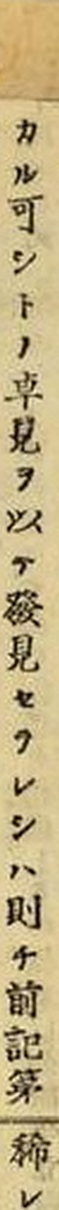カル可シトノ卓見ヲ以テ發見セラレシハ則チ前記第
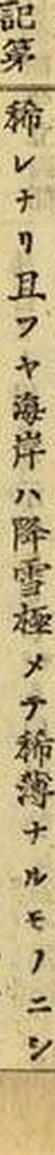稀レナリ且ツヤ海岸ハ降雪極メテ希薄ナルモノニシ
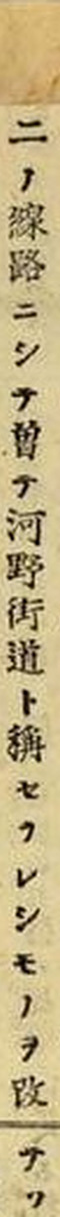二ノ線路ニシテ曾テ河野街道ト稱セラレシモノヲ改
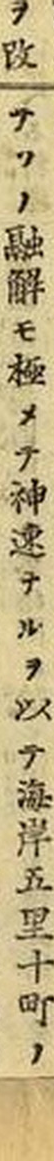テソノ融解モ極メテ神速ナルヲ以テ海岸五里十町ノ
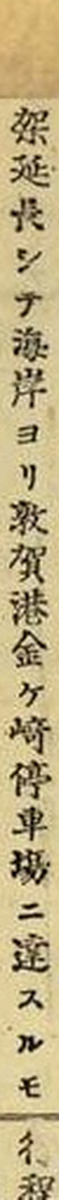架延長シテ海岸ヨリ敦賀港金ケ﨑停車塲ニ達スルモ
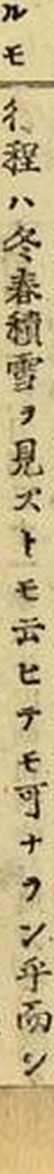行程ハ冬春積雪ヲ見ズトモ云ヒテモ可ナラン乎而シ
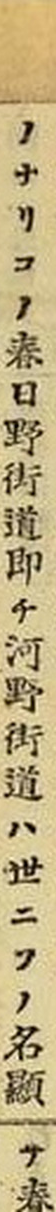ノナリコノ春日野街道即チ河野街道ハ世ニソノ名顕
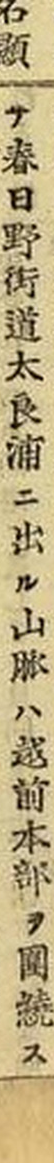テ春日野街道太良浦ニ出ル山脈ハ越前本部ヲ囲繞ス
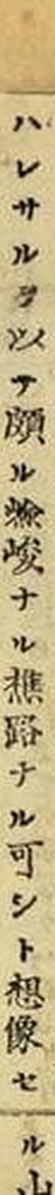ハレサルヲ以テ頗ル嶮峻ナル樵路ナル可シト想像セ
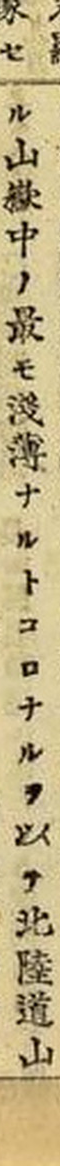ル山獄中ノ最モ淺薄ナルトコロナルヲ以テ北陸道山
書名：温古集 五巻
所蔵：福井県文書館 Fukui Prefectural Archives
